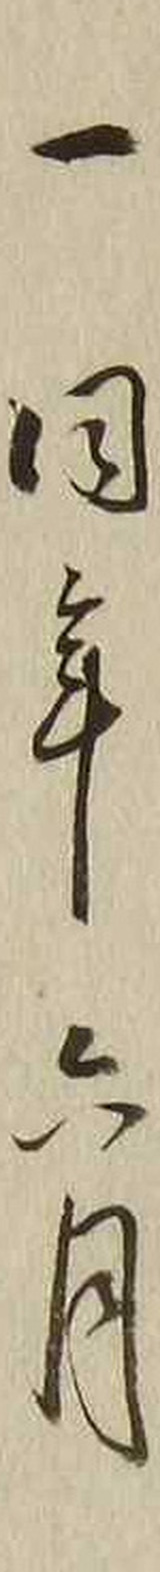一同年六月
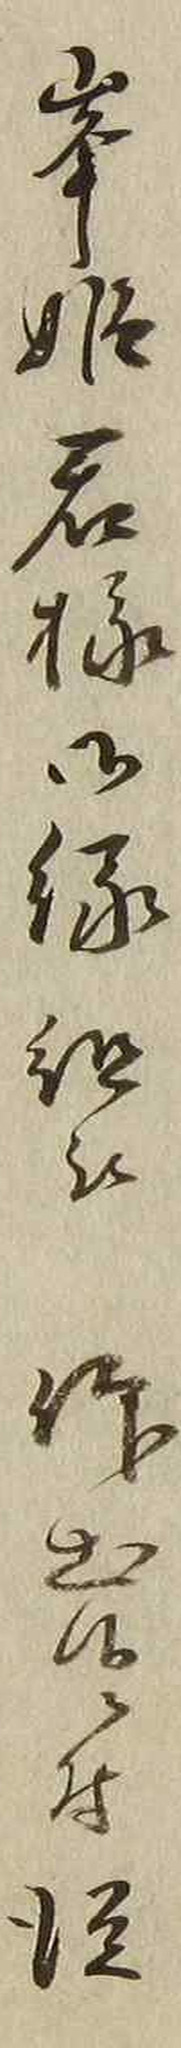峰姫君様御縁組被仰出候ニ付従
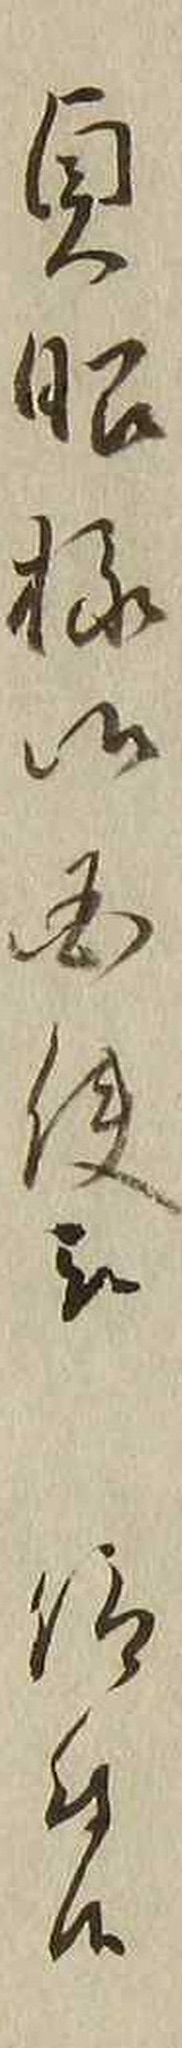貞昭様御国使被仰付候
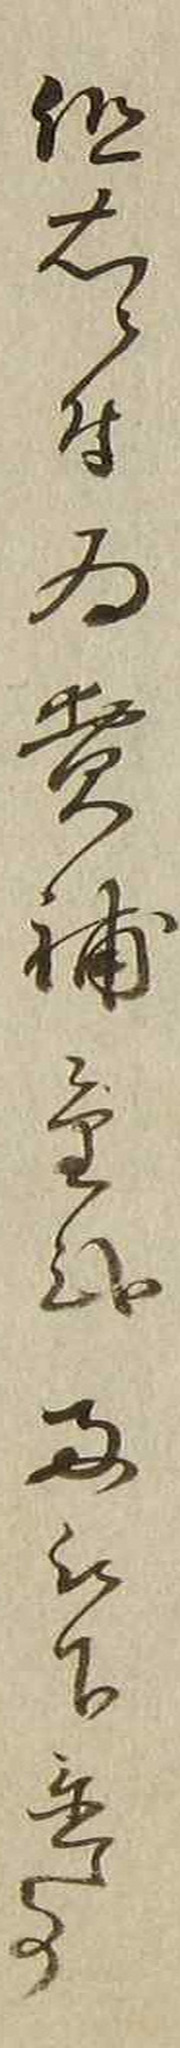但右ニ付為費補金弐両被下置候事
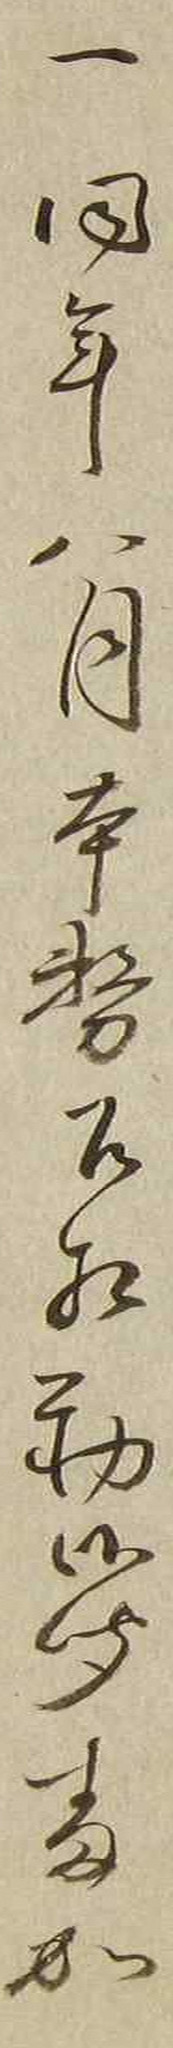一同年八月本務乍相勤御聞番加
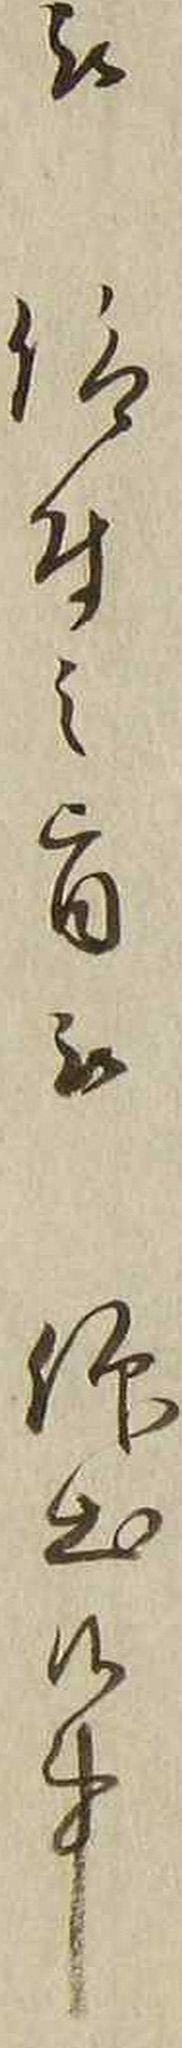被仰付之旨被仰出候事

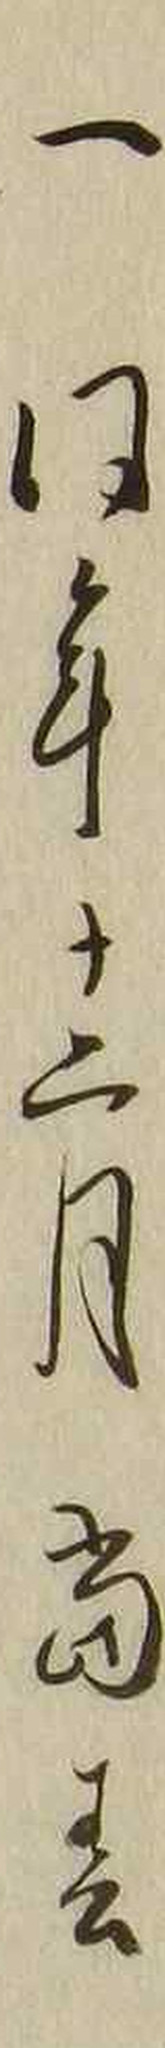一同年十二月当春
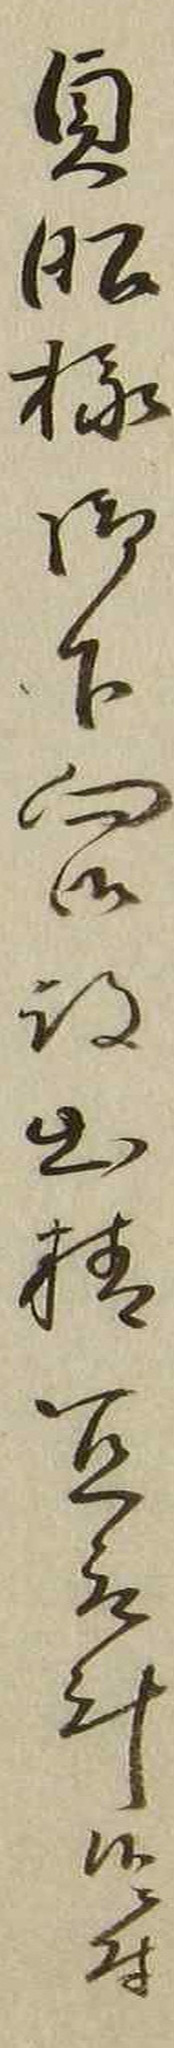貞昭様御下向候御役出精宜取計候ニ付
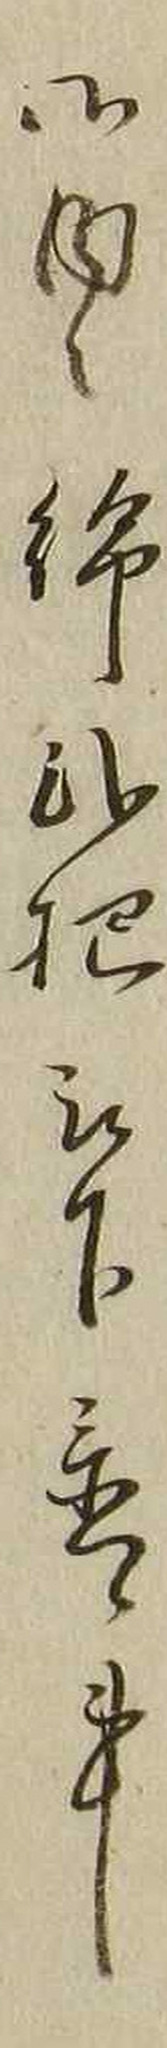御内々綿弐把被下置候事
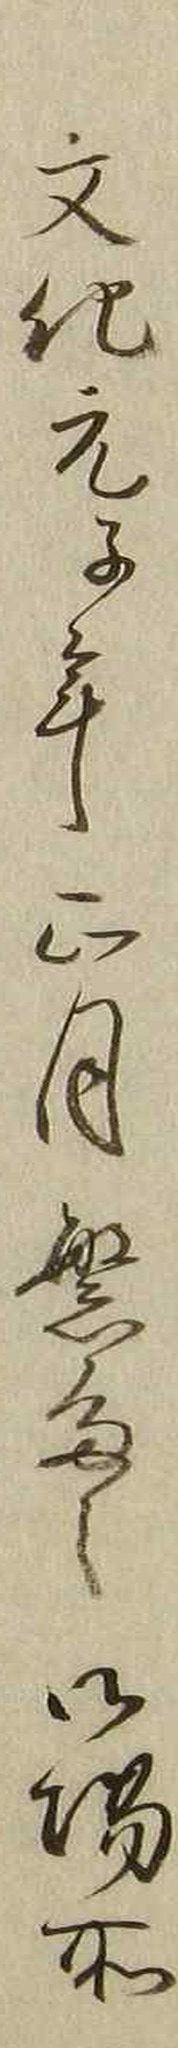一文化元子年正月繁多之御場所
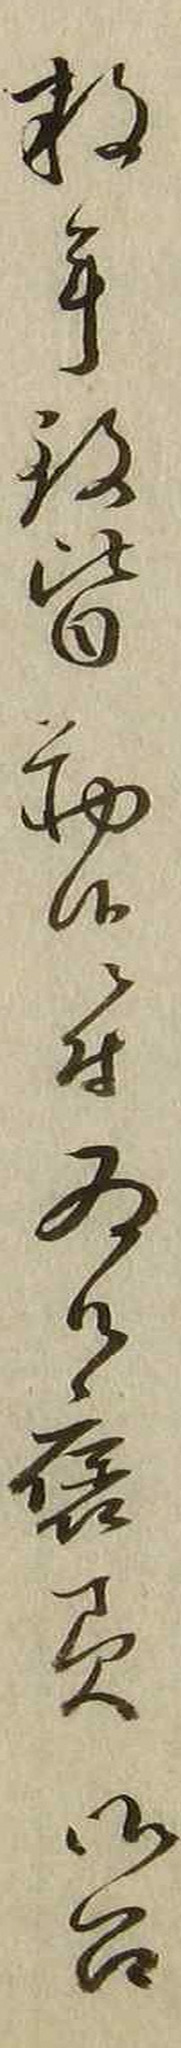数年致皆勤候ニ付為御褒美御召
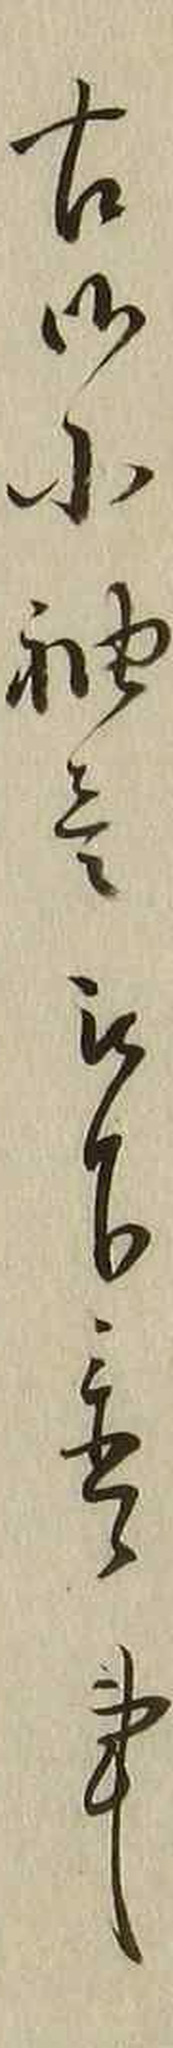古御小袖壱被下置候事
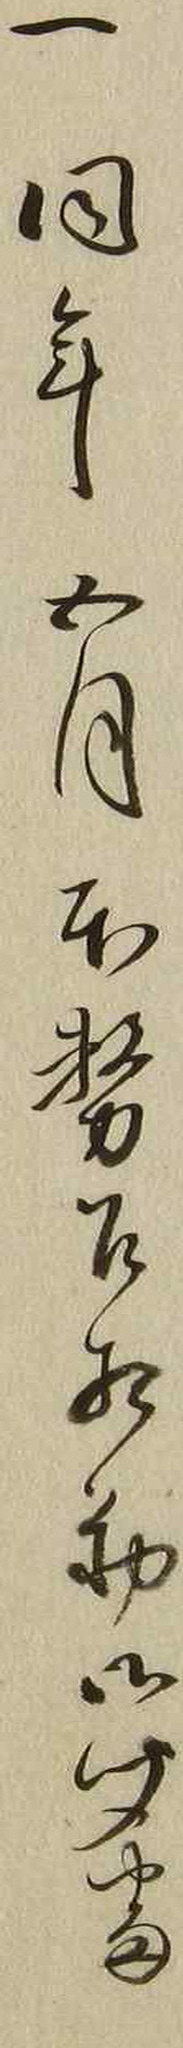一同年五月本務乍相勤御聞番
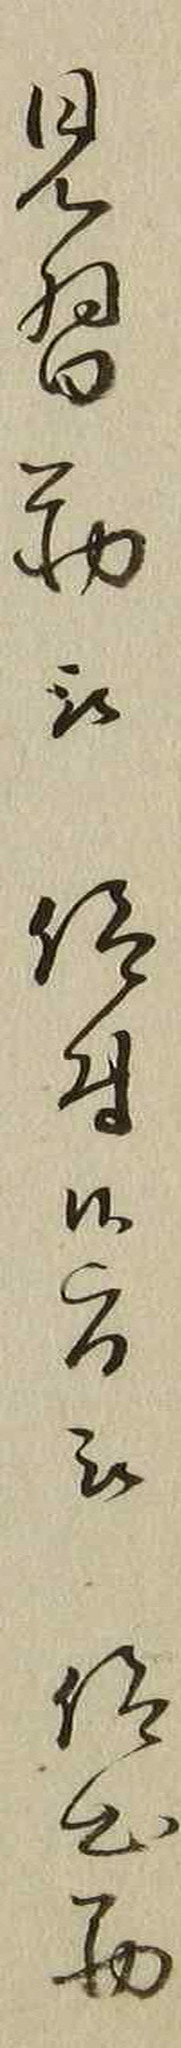見習勤被仰付候旨被仰出勤
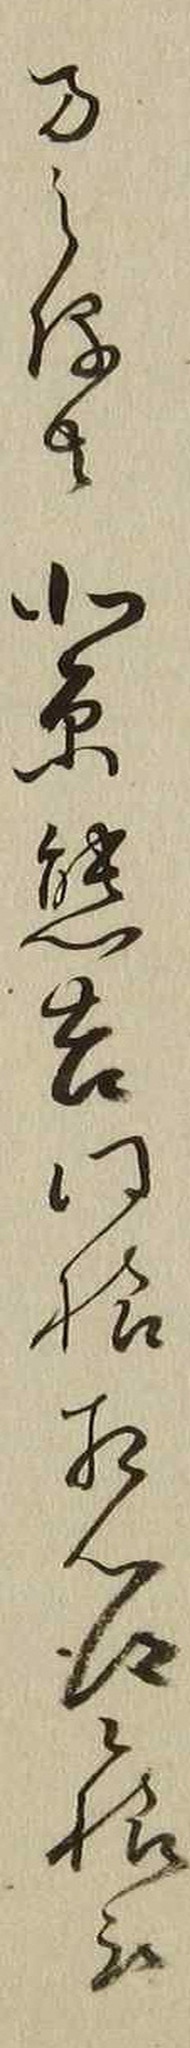方之儀者北原態吉同様相心得候様被
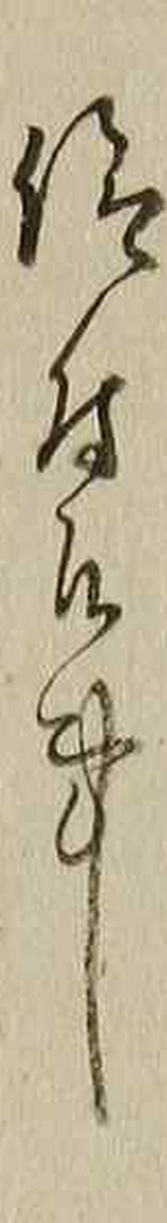仰付候事
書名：諸士系譜　巻之25　い之部25
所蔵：会津若松市立会津図書館
